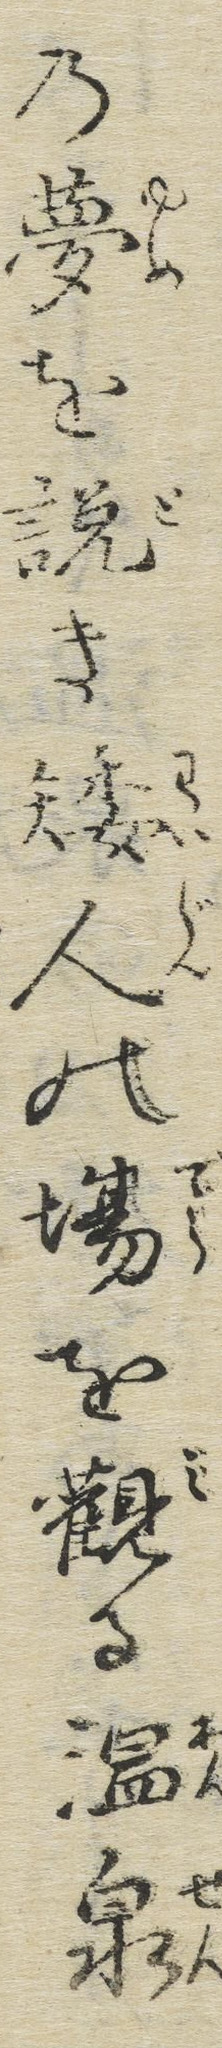の夢を説き矮人の場を観る温泉
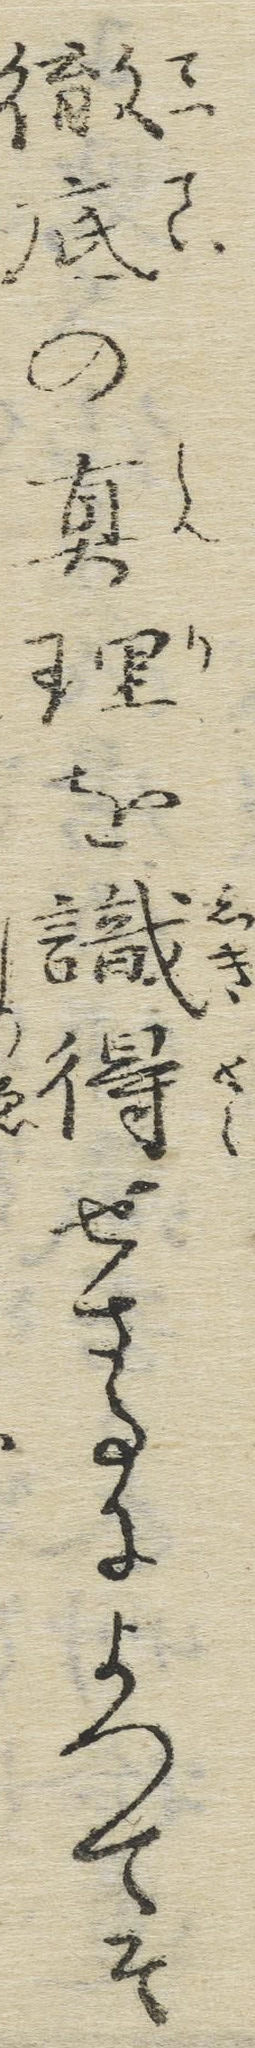徹底の真理を識得せさるによつてそ
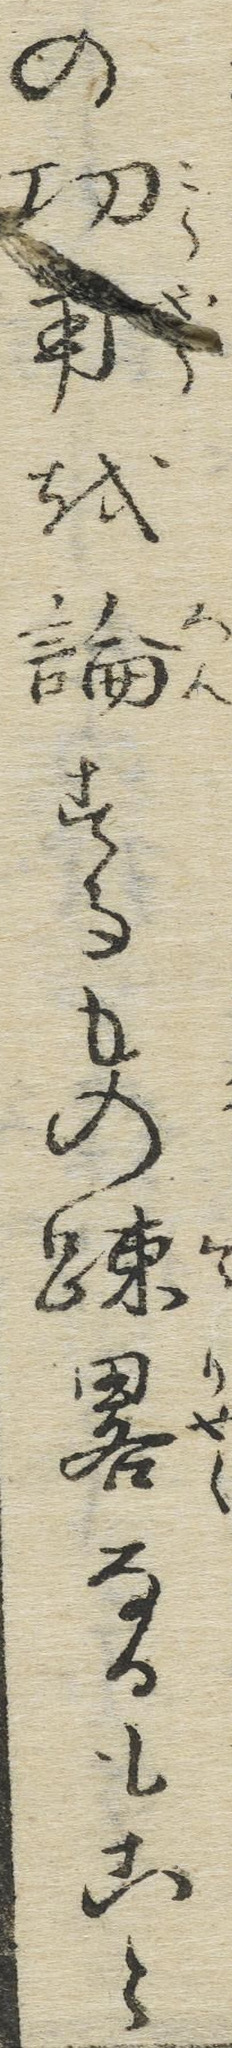の功用を論するもの疎略なるもこと
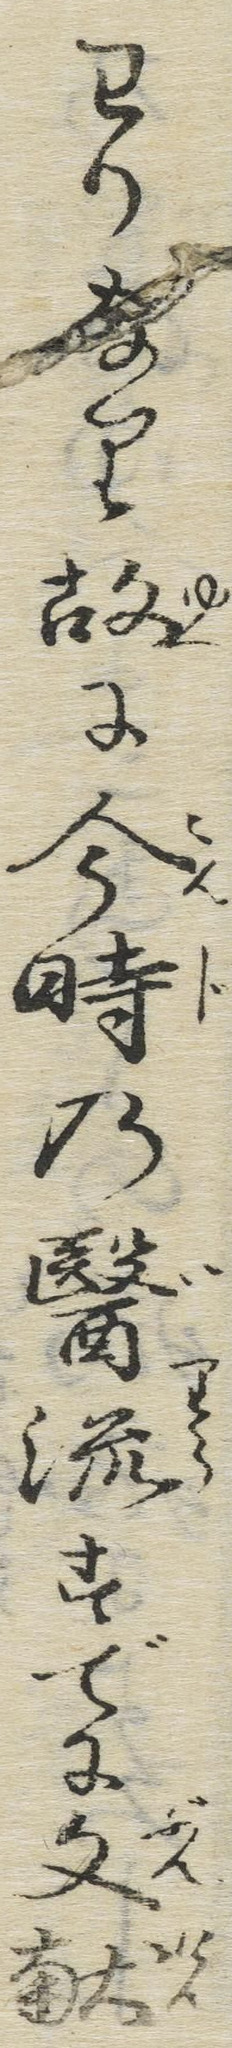わりなり故に今時の医流すでに文献
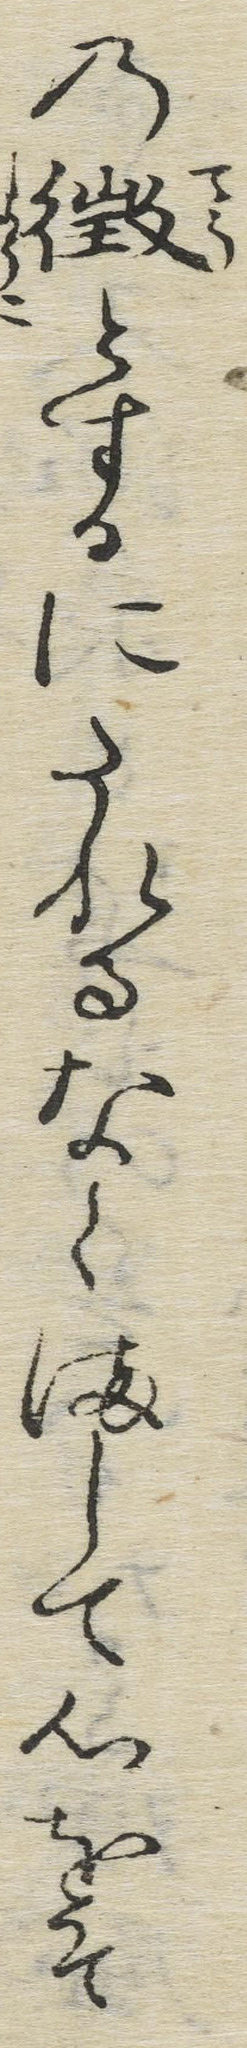の徴とするにたれるなくまして心をそ
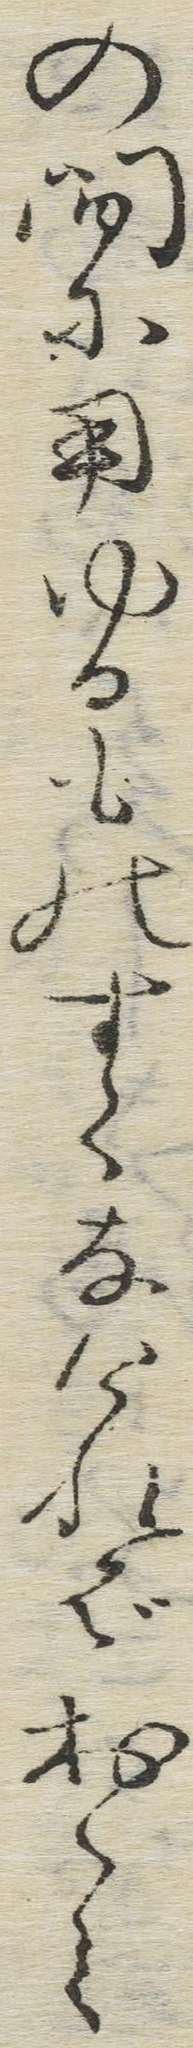の間に用ゆるものすくなければおゝく
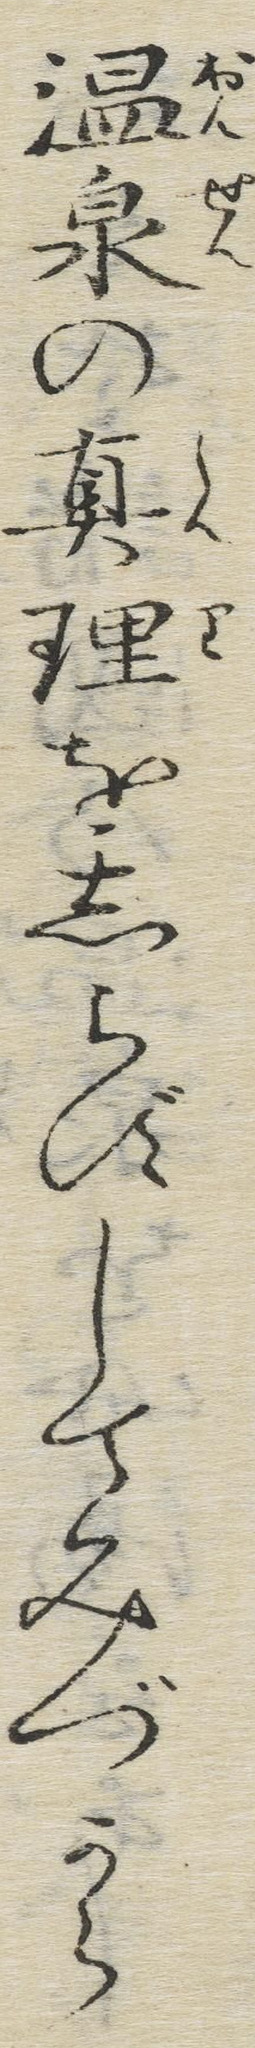温泉の真理をしらずしてみづから
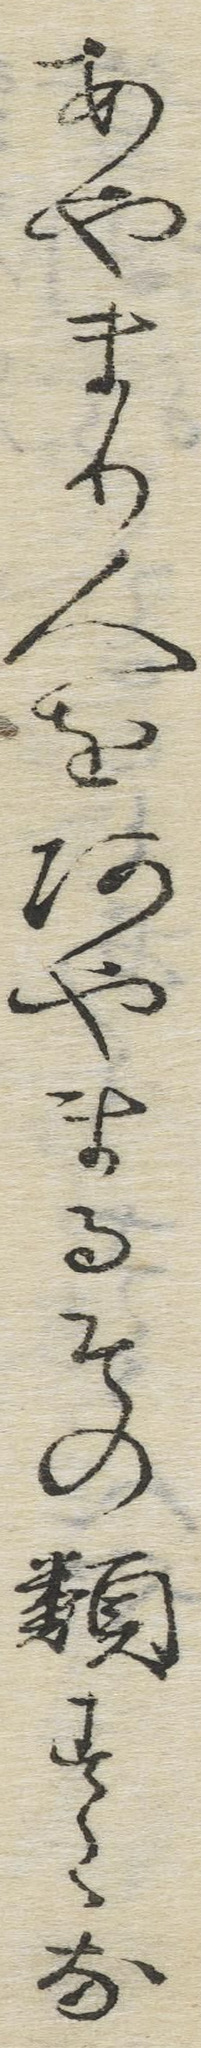あやまり人をあやまるその類すくな
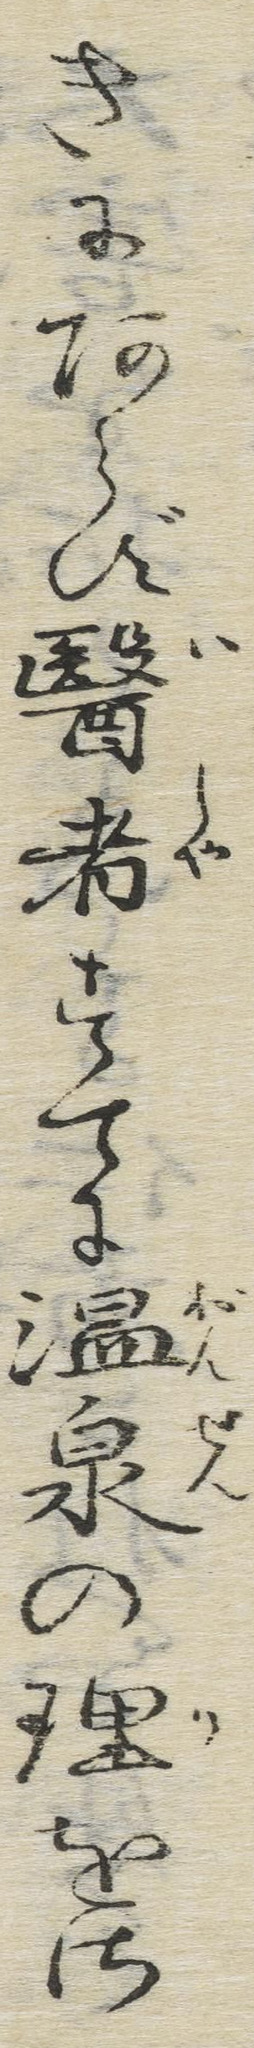きにあらず医者すてに温泉の理をさ
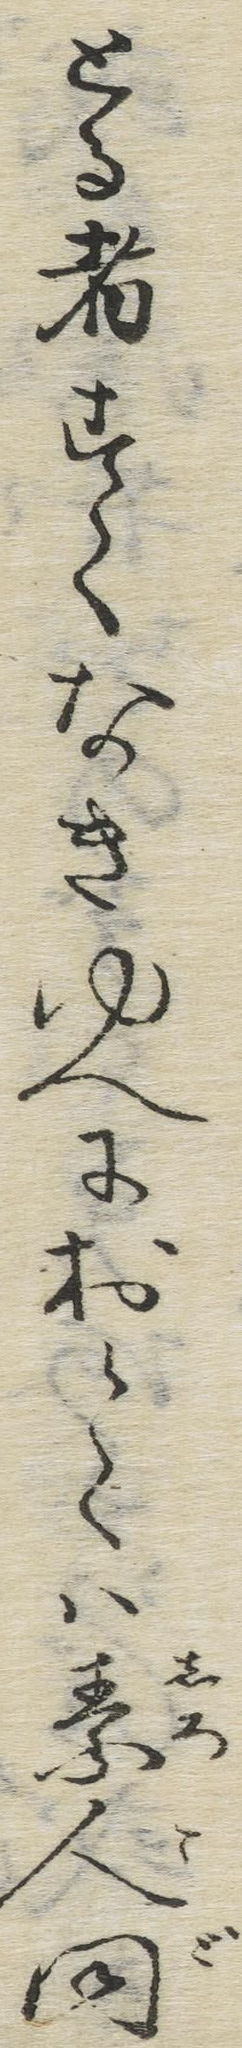とる者すくなきゆへにおゝくは素人同
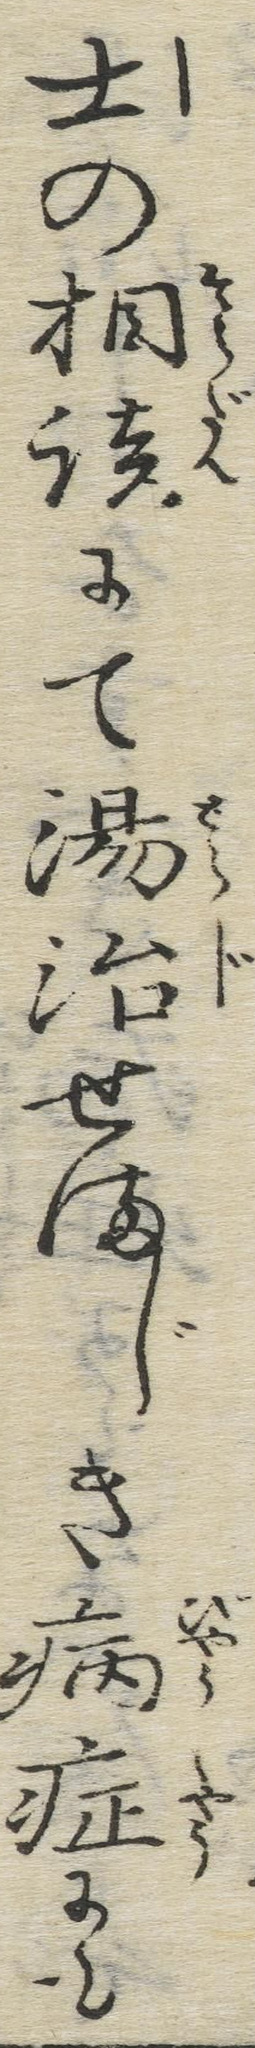士の相談にて湯治せまじき病症にも

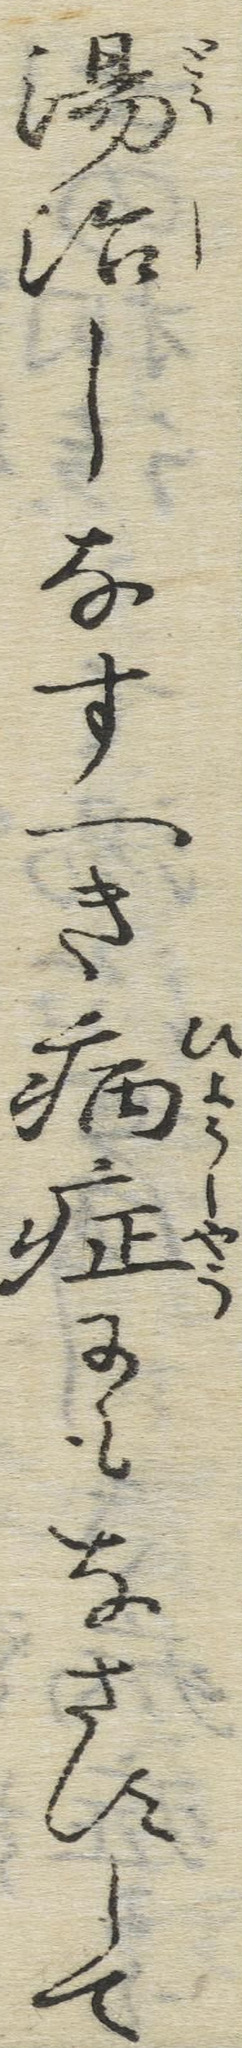湯治しなすへき病症にもなさすして
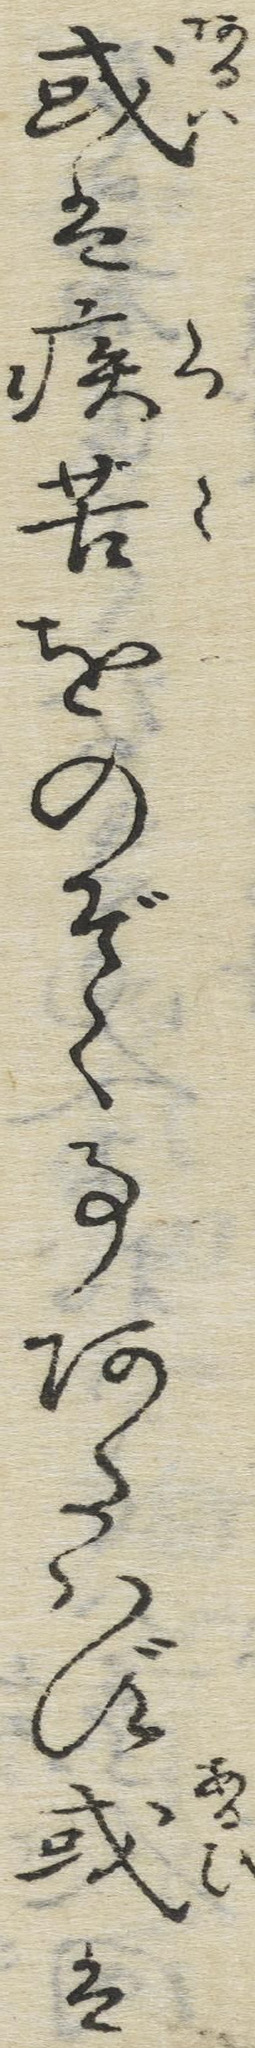或は疾苦をのぞく事あたはず或は
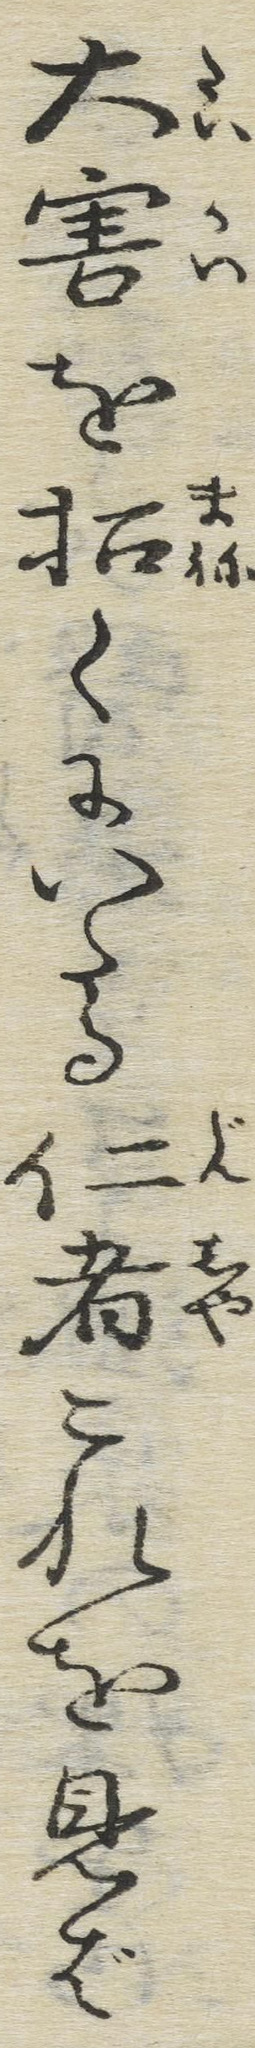大害を招くにいたる仁者これを見ば
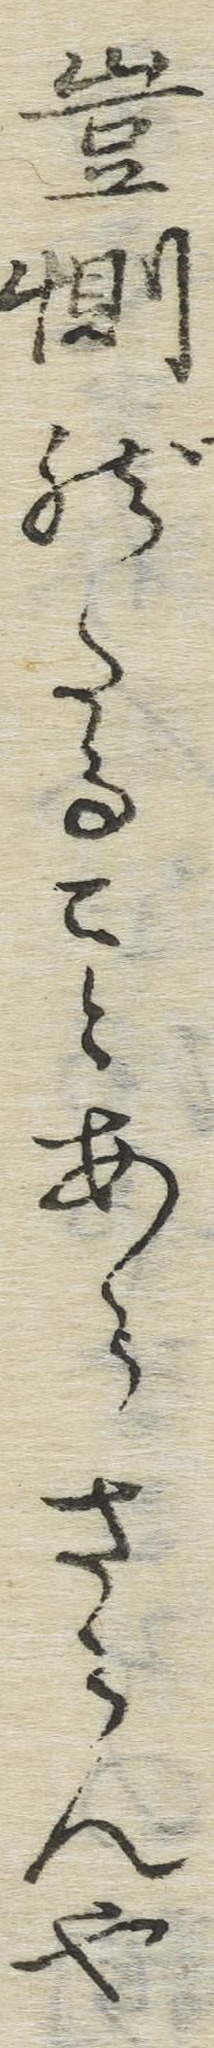豈惻然たることあらさらんや
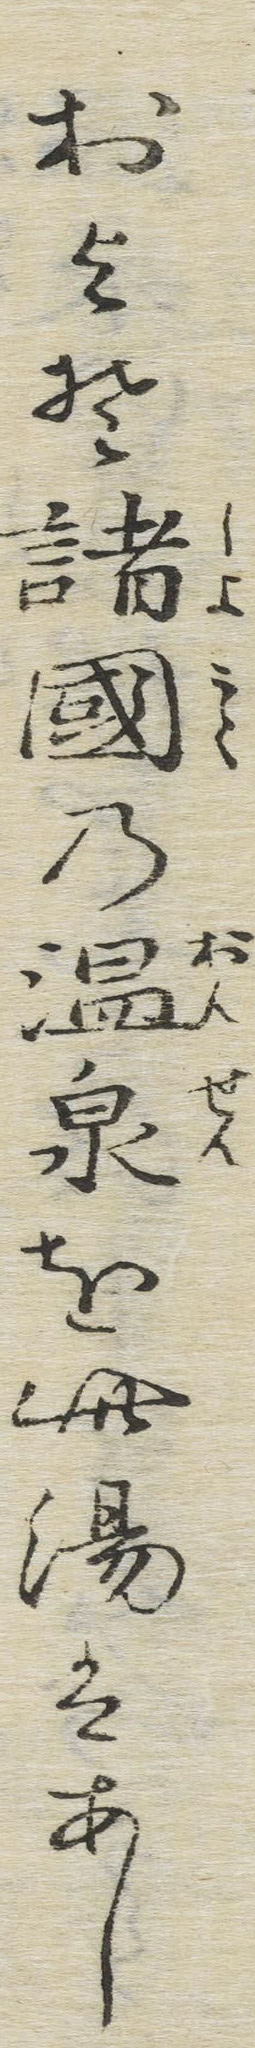一およそ諸国の温泉を此湯はあし
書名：温泉考
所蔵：東京大学地震研究所図書室 Earthquake Research Institute Library, The University of Tokyo, JAPAN
